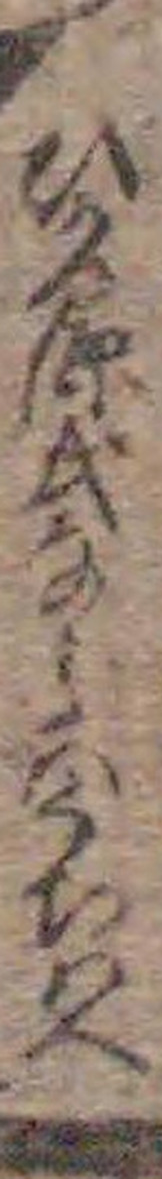ひかる源氏ならばうちワへ
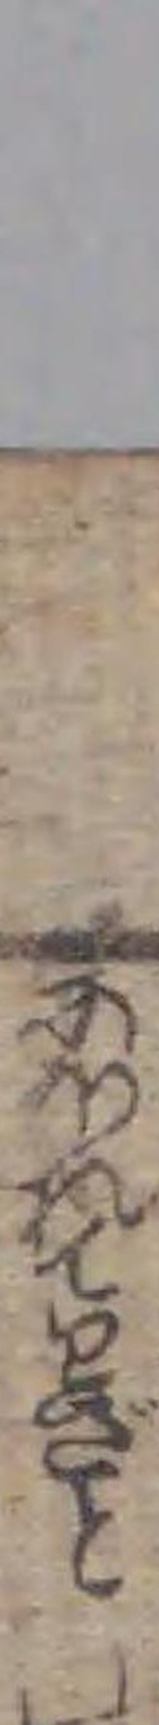にほれてわざと
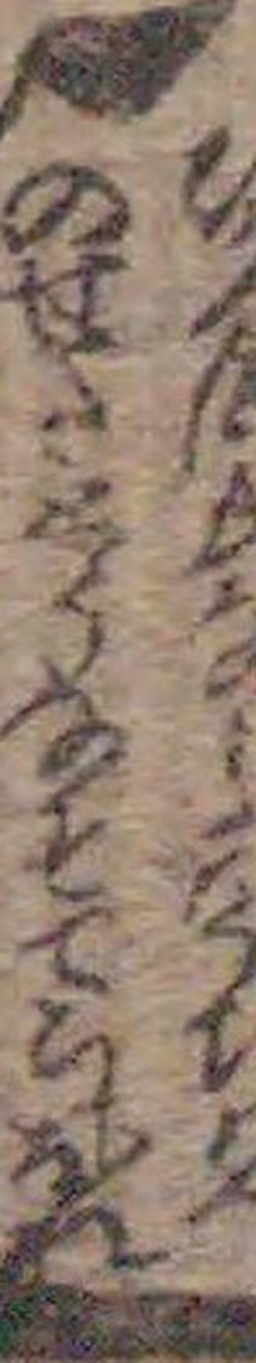のせたとうなすてうなれ
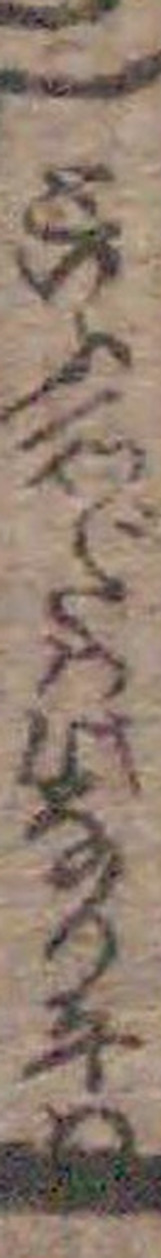といふ所だは此なり平は
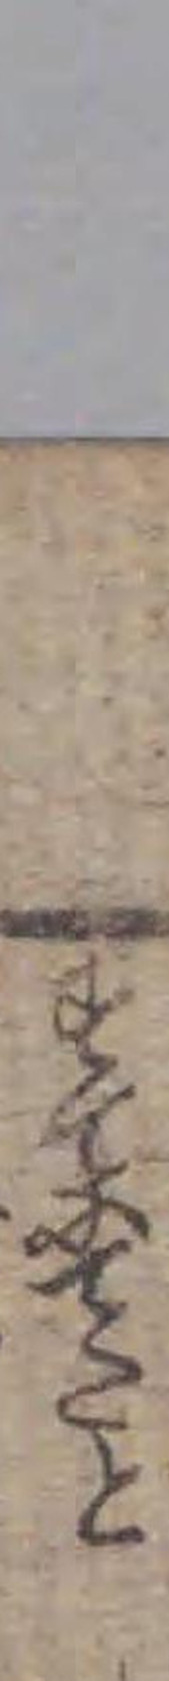すてにてたと
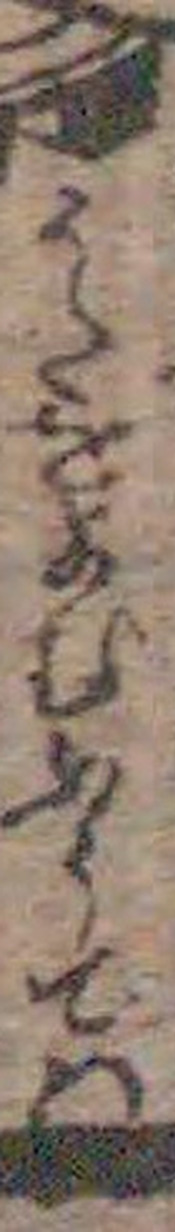うたをよむふうでは
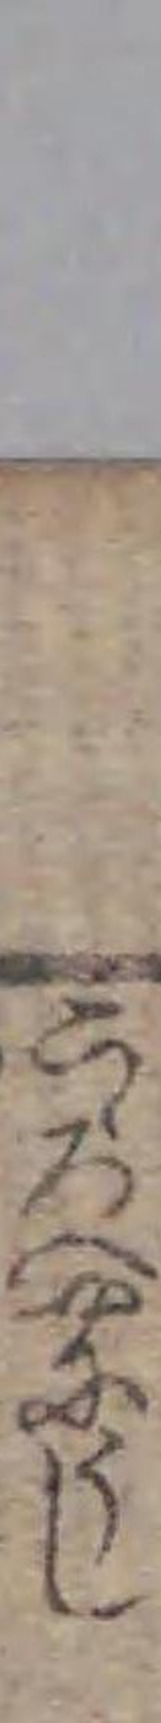こころへやにくし
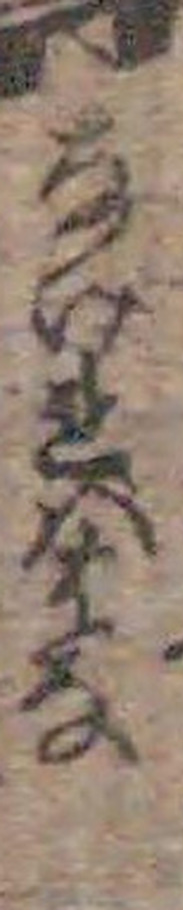なければはな
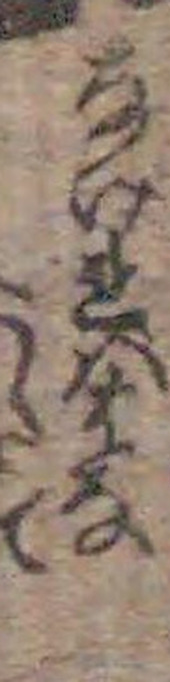なければはな
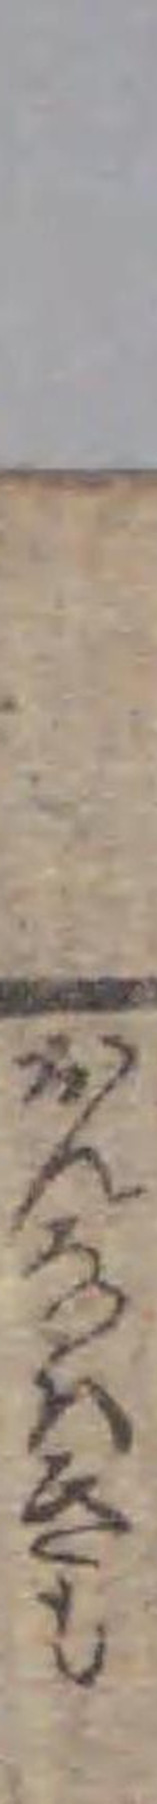おんなはきも
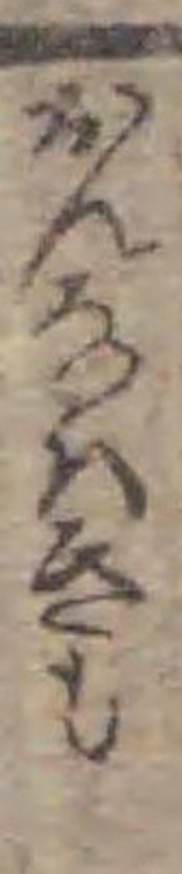おんなはきも
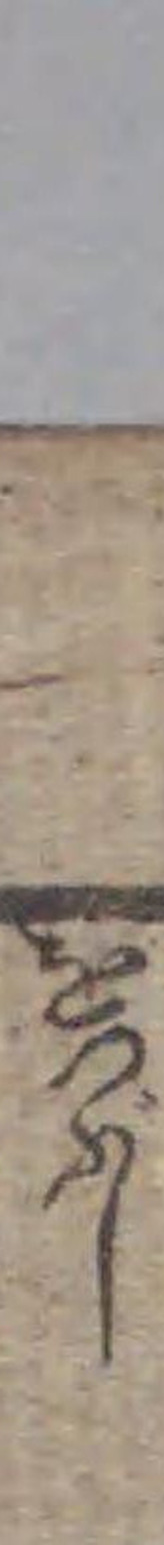をつぶし
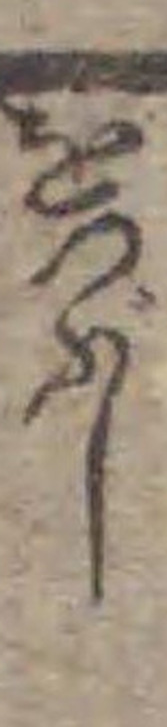をつぶし
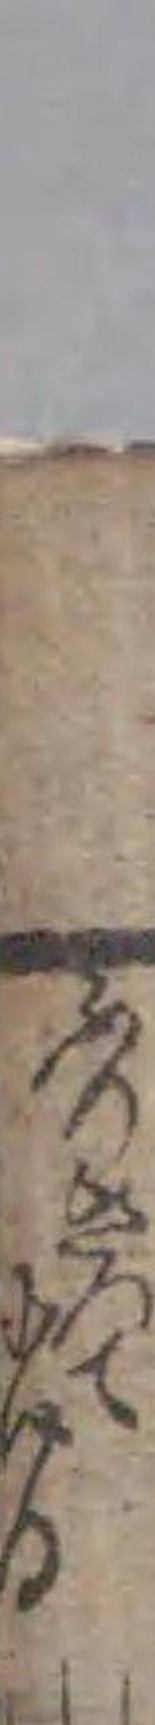ふつきつて
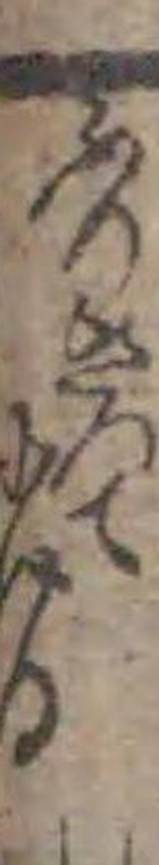ふつきつて
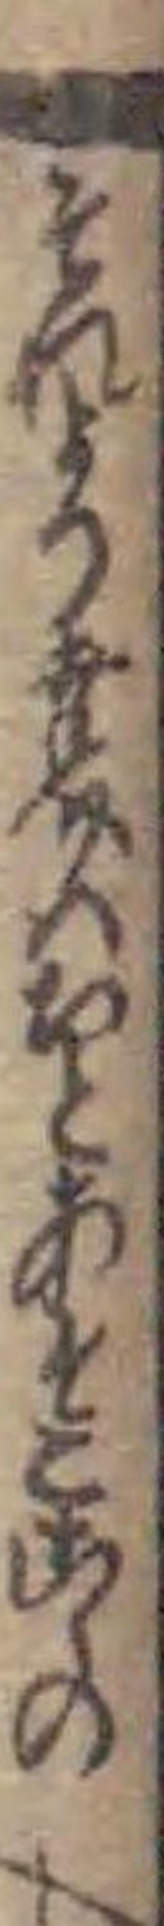それより幸介はちとあそここゝの
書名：通風伊勢物語 : 3巻
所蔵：国立国会図書館 National Diet Library, JAPAN
